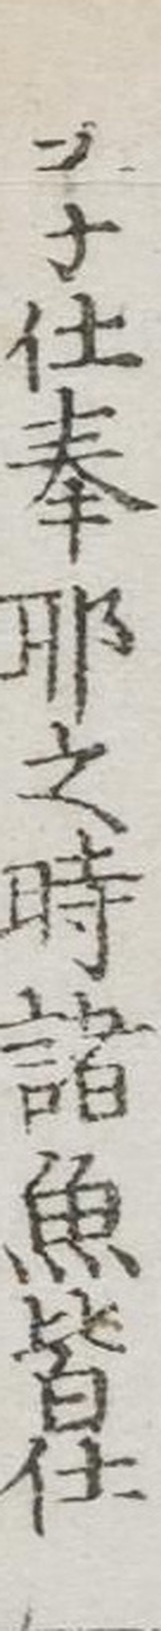子仕奉耶之時諸魚皆仕
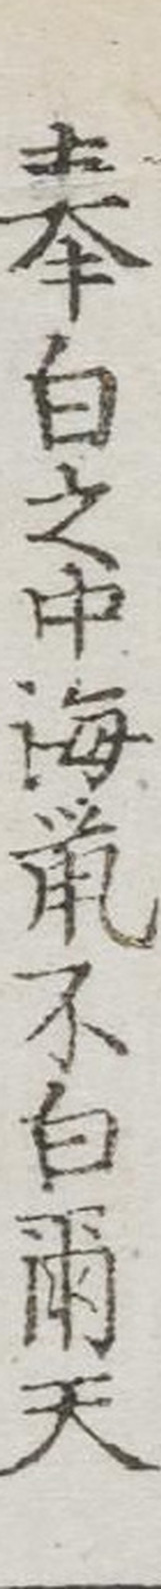奉白之中海鼠不白爾天
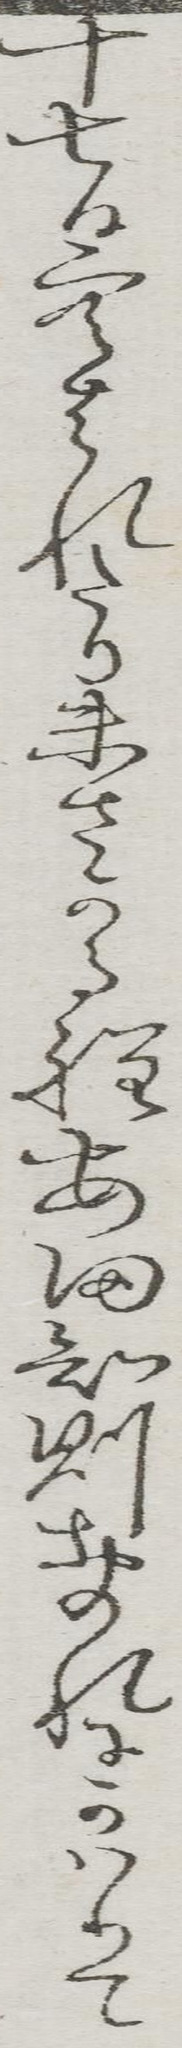十七日空はれたり未さかる程安田知則おのれにかはりて
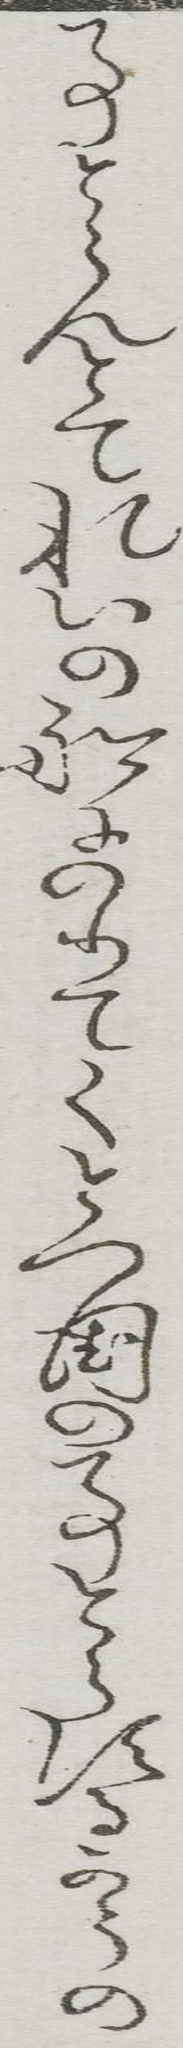事とらんとてれいの船にのりてくとつ国の事とらするかうの
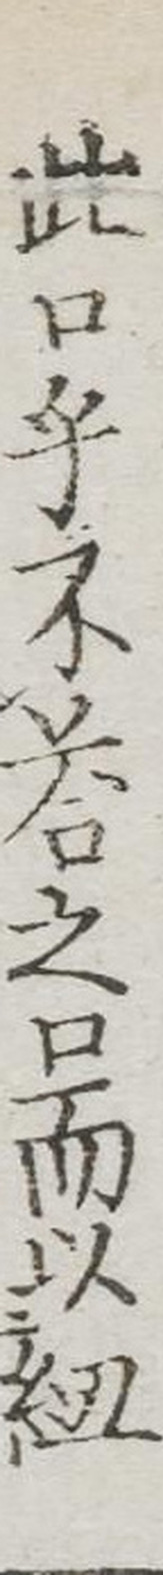此口乎不答之口而以紐
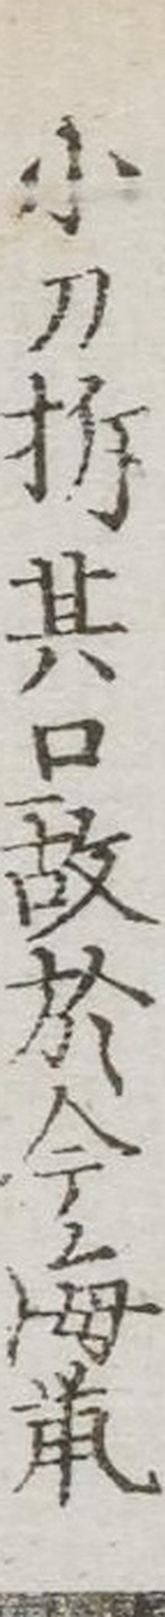小刀折其口故於今海鼠
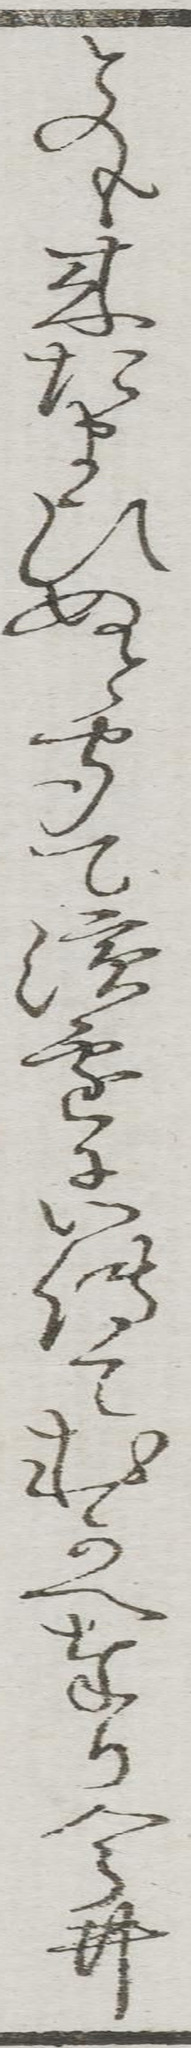とのも来たまひぬと聞て浜辺にいててむかへ奉り今井
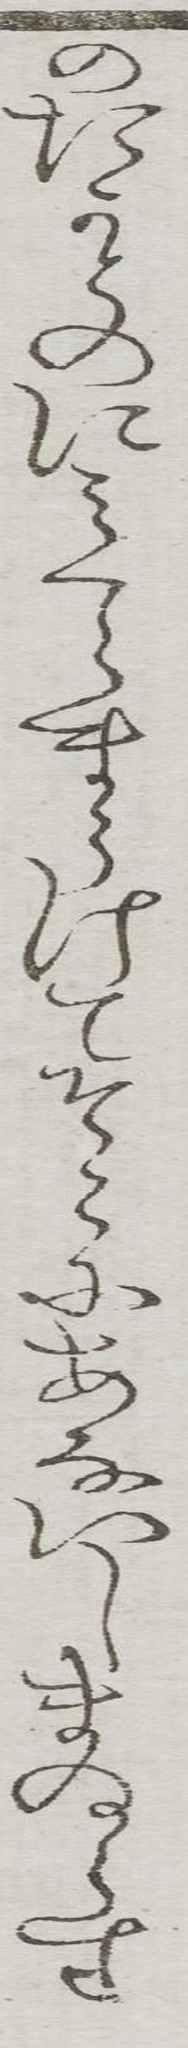のたかとのにみくらまうけてそこにあないしまゐらす
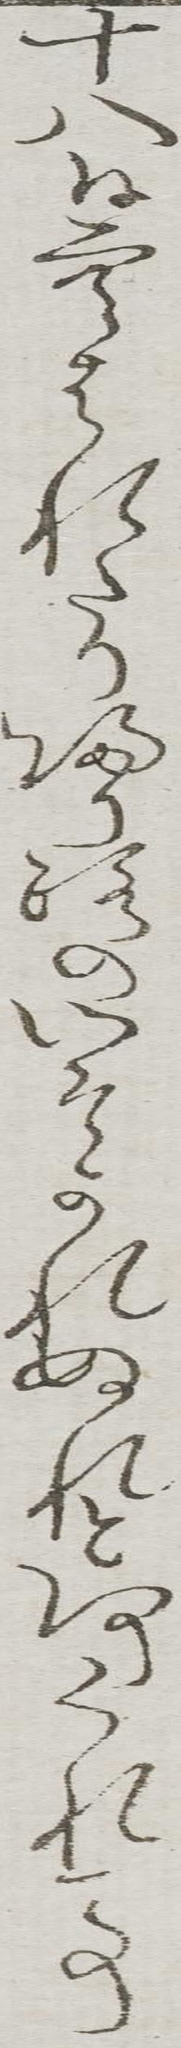十八日空はれたり帰り路のいそかれぬと何くれ事
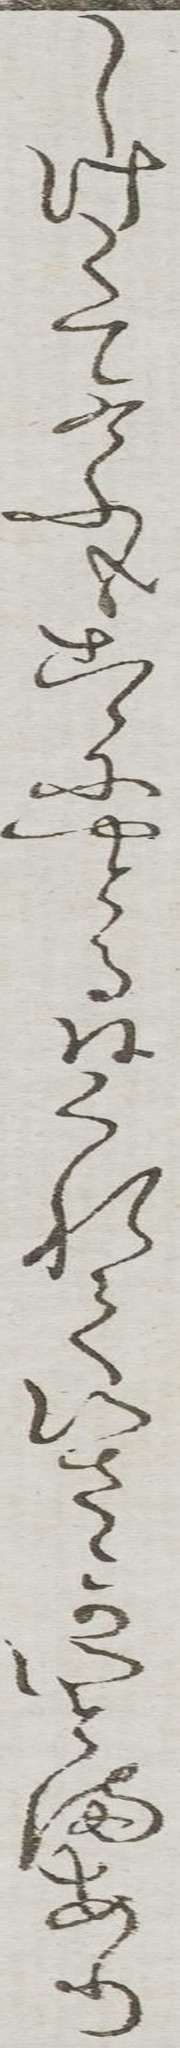しけくてけふもこゝにやとる日くれていさゝかいとまあり
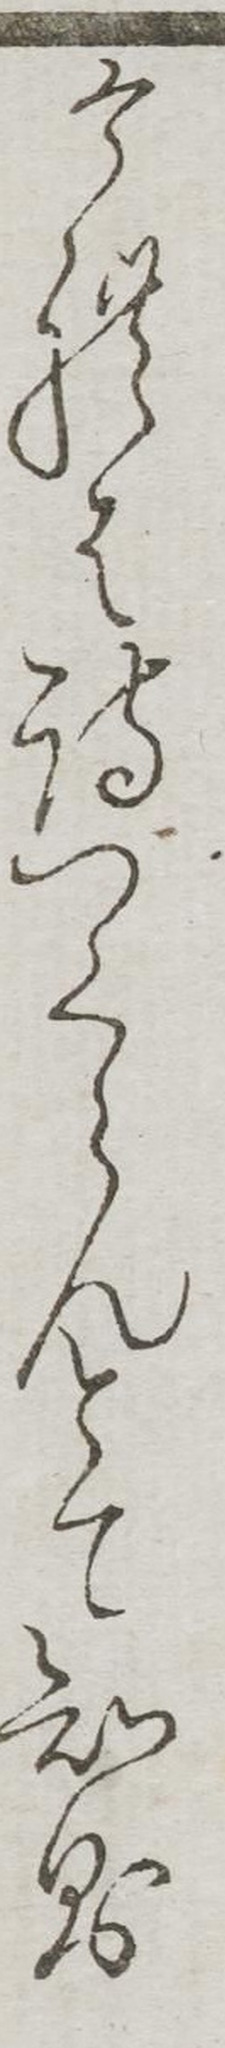けれは詩つくらんとて知則

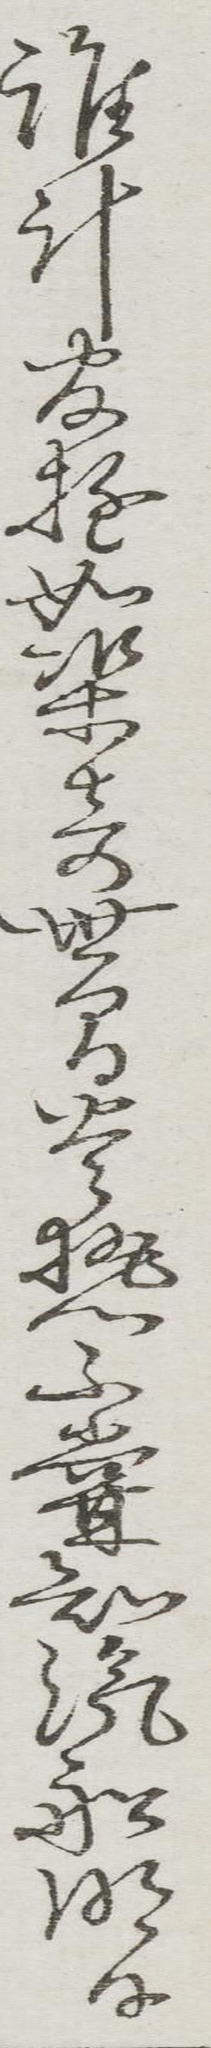誰計官遊如染奇世間炎熱不嘗知汽船明日
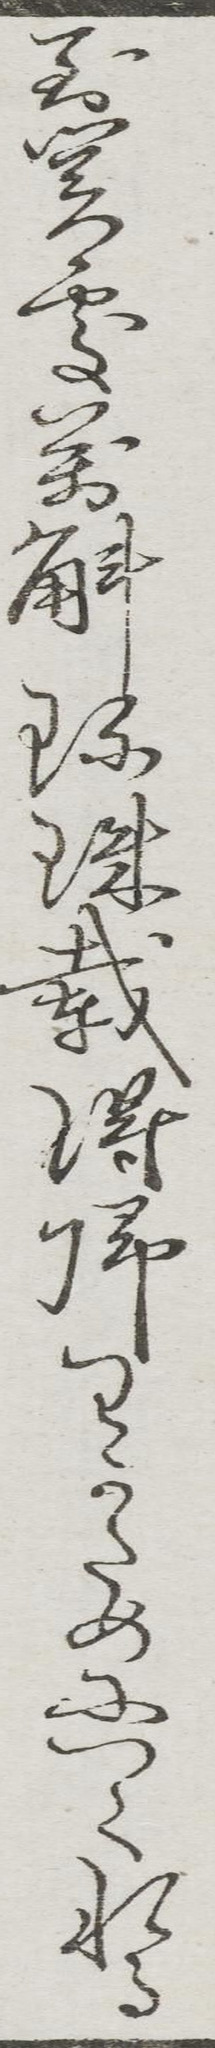別冥処萬斛珍珠載得帰わかためにつくれる
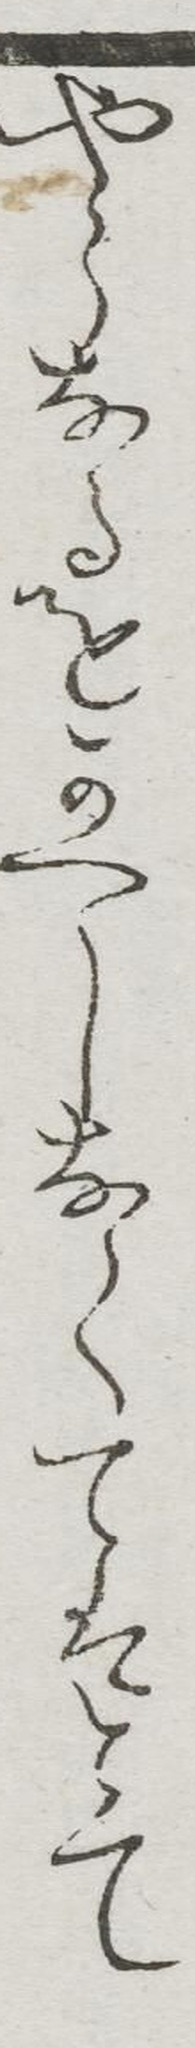やうなるをかへしなくてはとて
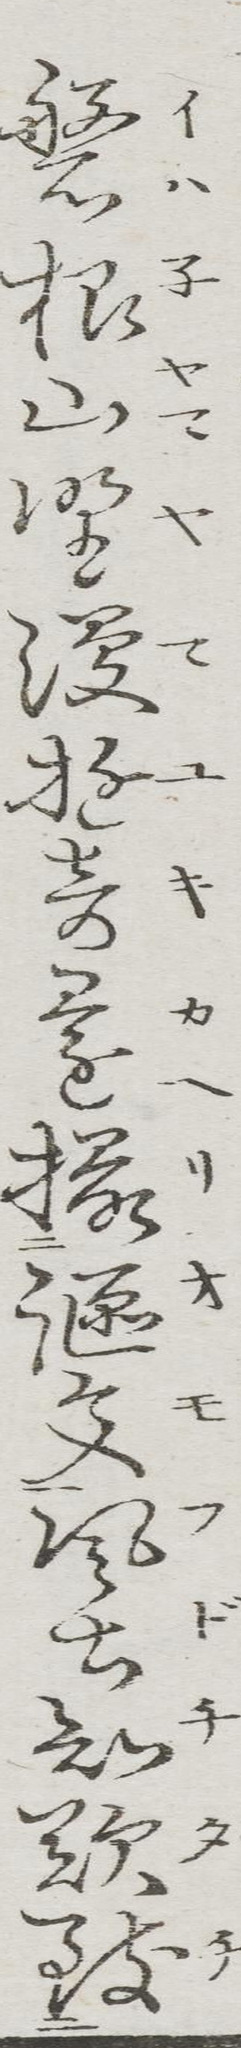磐根山野漫遊奇還撮謳文風土知歎致
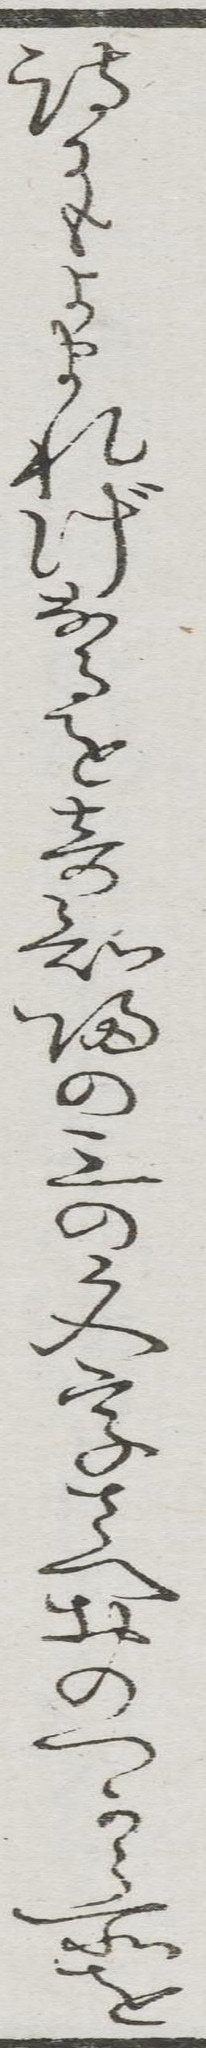詩にもよまれげなるを奇知帰の三の文字さへおのつから所を
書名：挿画熱海日記　全
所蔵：東京大学地震研究所図書室 Earthquake Research Institute Library, The University of Tokyo, JAPAN
